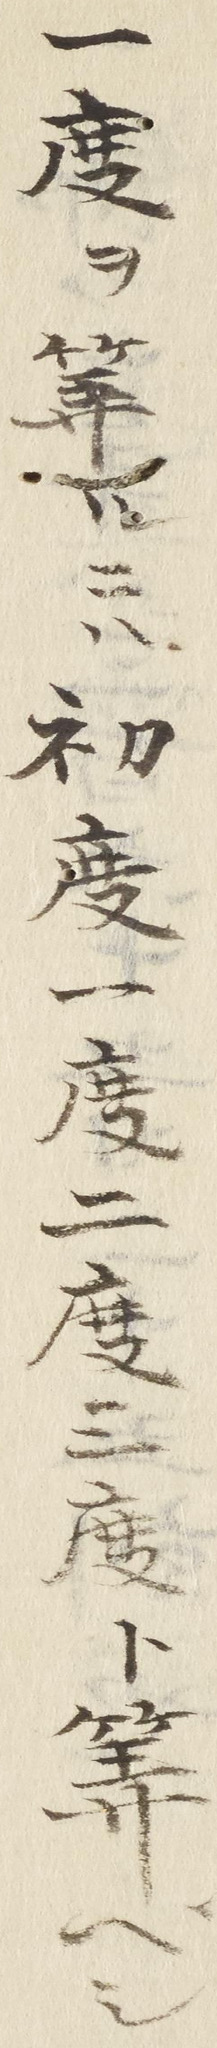一度ヲ等ルニハ初度一度二度三度ト算ベシ
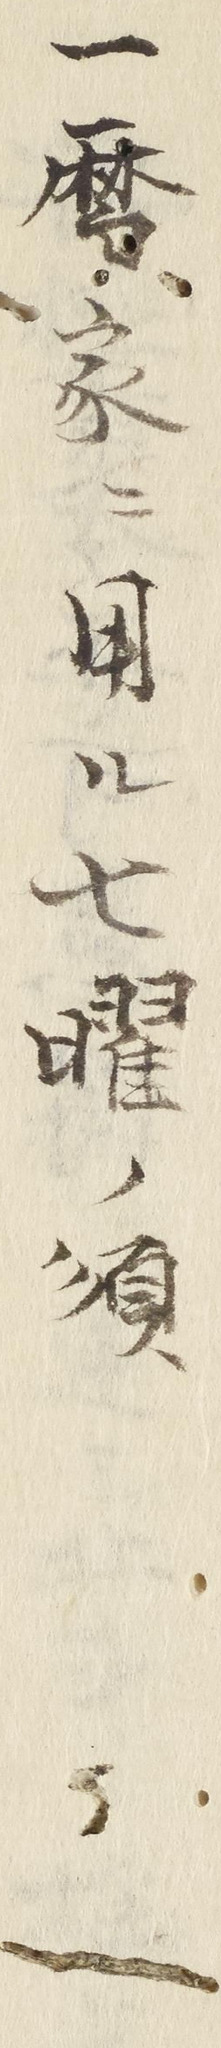一暦家ニ用ル七曜ノ順
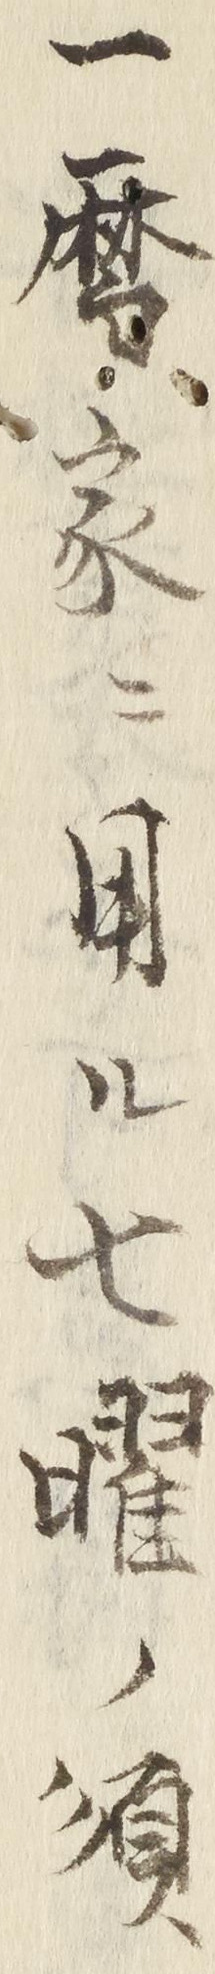一暦家ニ用ル七曜ノ順
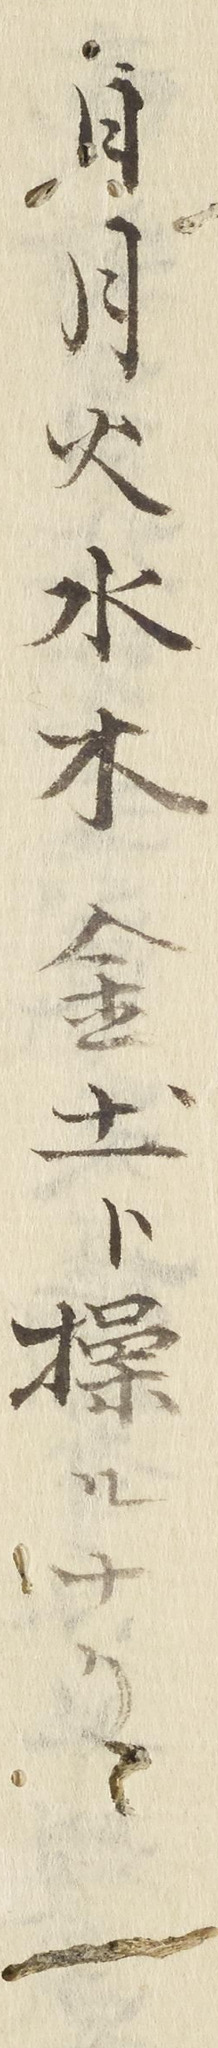日月火水木金土ト操ルナリ
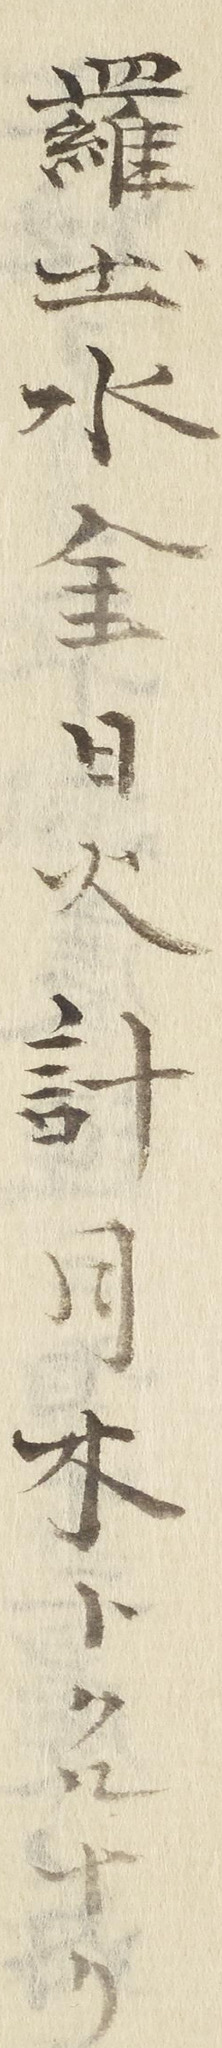羅土水金日火計月木トクルナリ
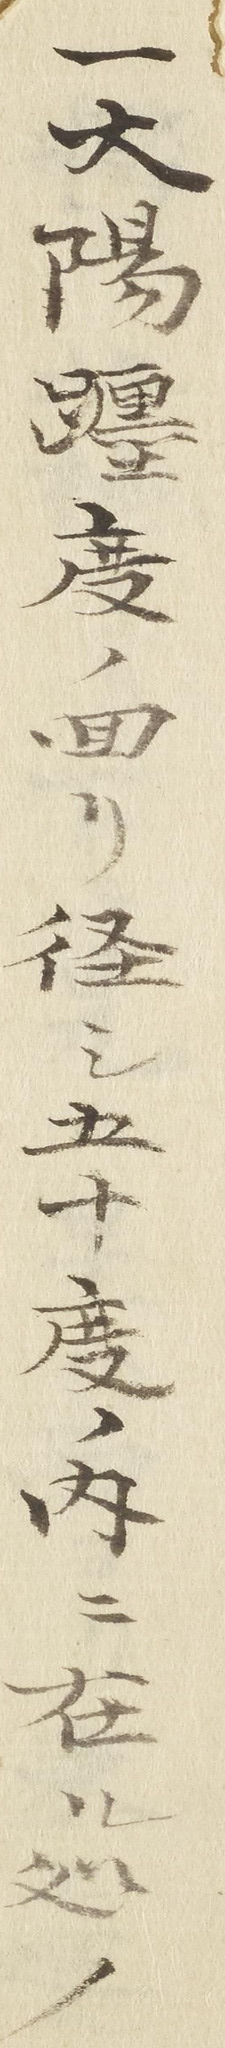一大陽躔度ノ回リ径シ五十度ノ内ニ在ル処ノ
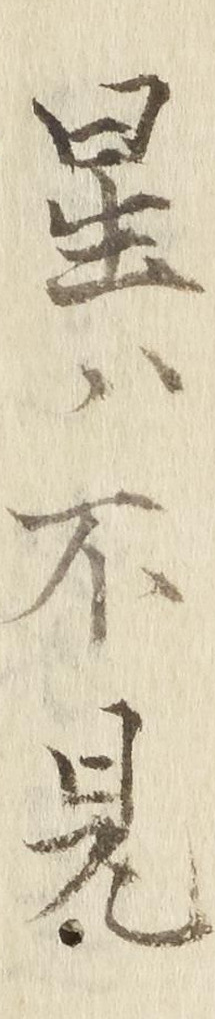星ハ不見
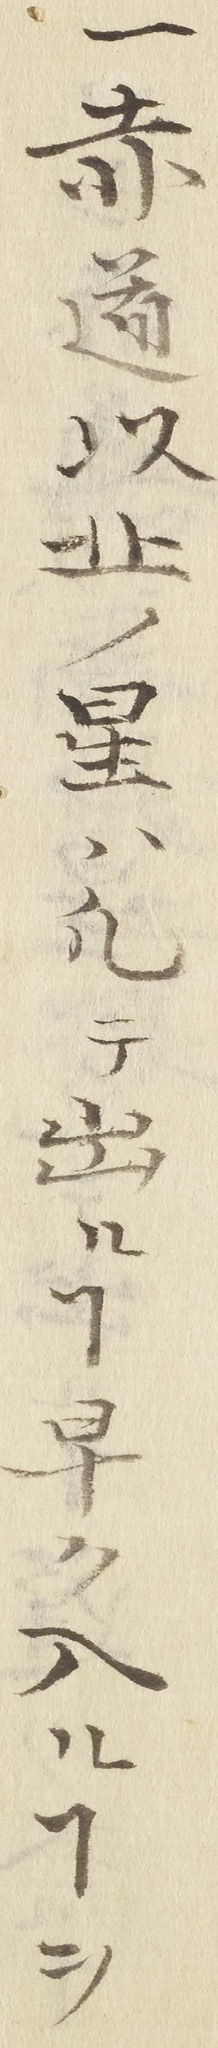一赤道以北ノ星ハ凡テ出ルコト早ク入ルコトを

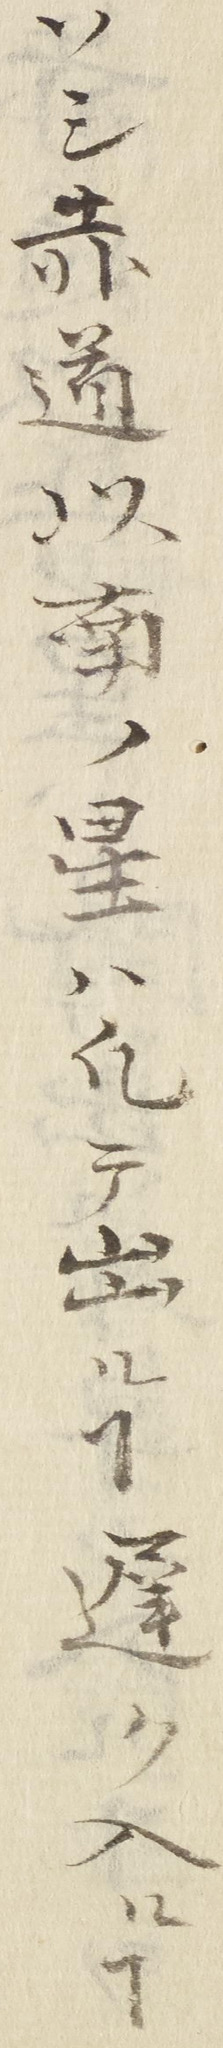ソシ赤道以南ノ星ハ凡テ出ルコト遅ク入ルコト
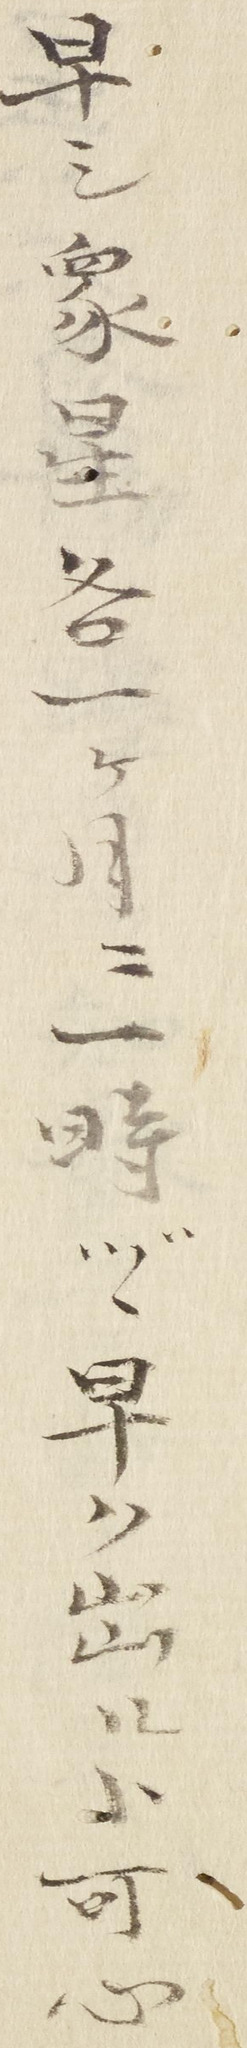早シ象星各一ヶ月ニ一時ヅヽ早ク出ルト可心
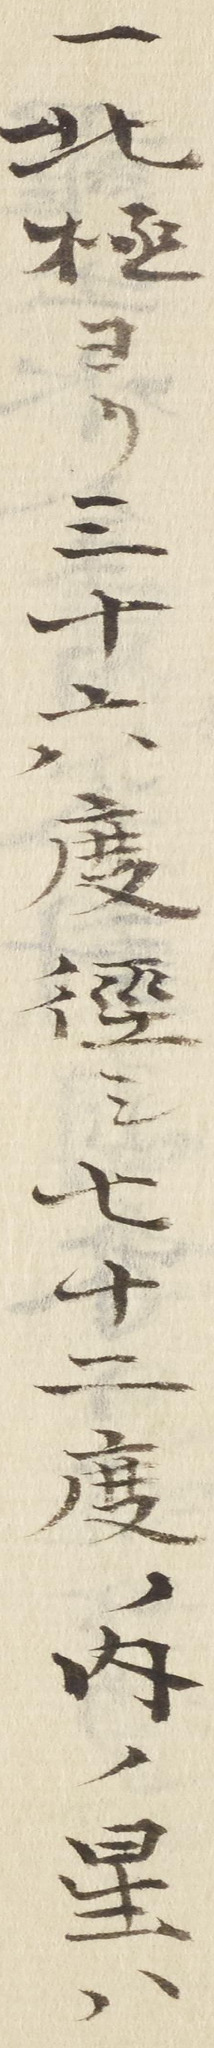一北極ヨリ三十六度径シ七十二度ノ内ノ星ハ
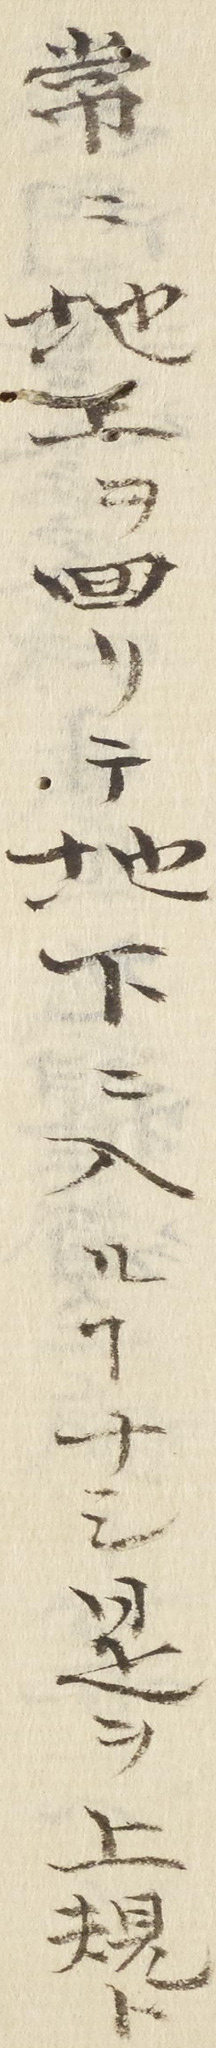常ニ地上ヲ回リテ地下ニ入ルコトナシ是ヲ上規ト
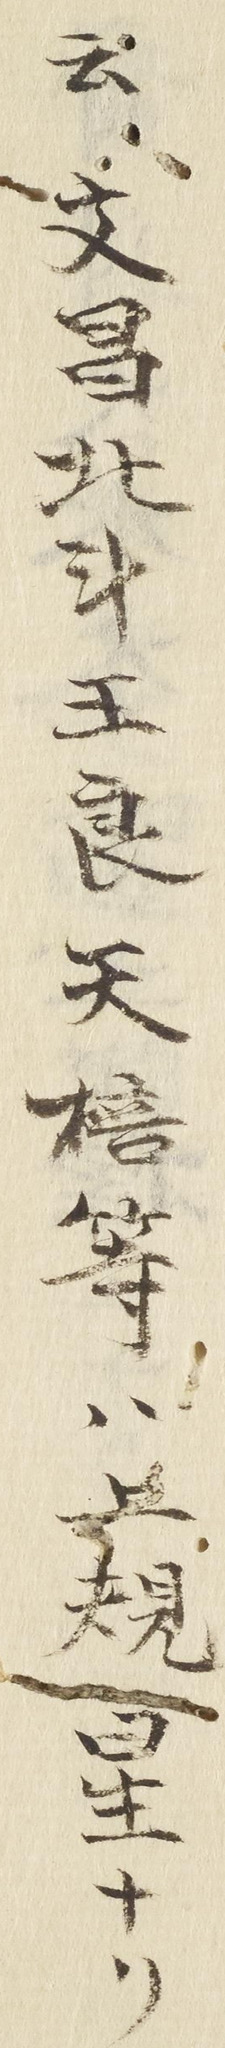云文昌北斗王良天棓等ハ上規星ナリ
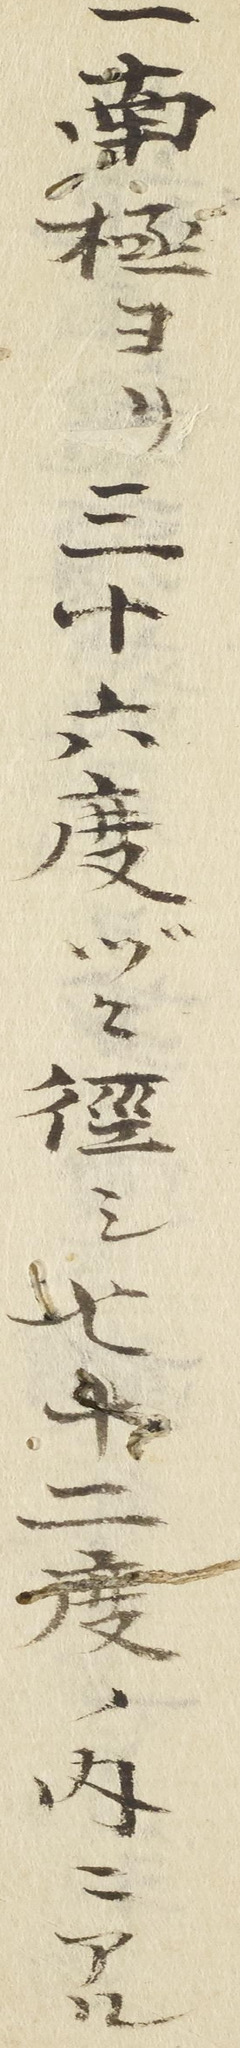一南極ヨリ三十六度ヅヽ径シ七十二度ノ内ニアル
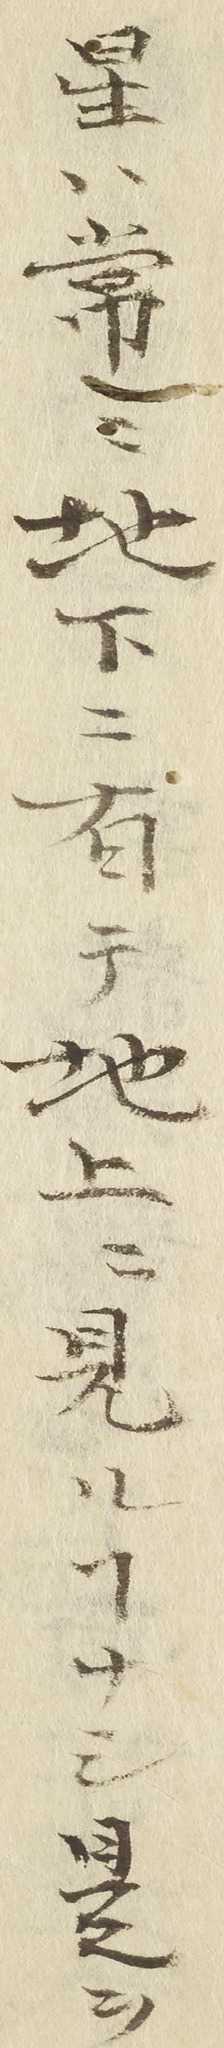星ハ常ニ地下ニ有テ地上ニ見ルコトナシ是ヲ
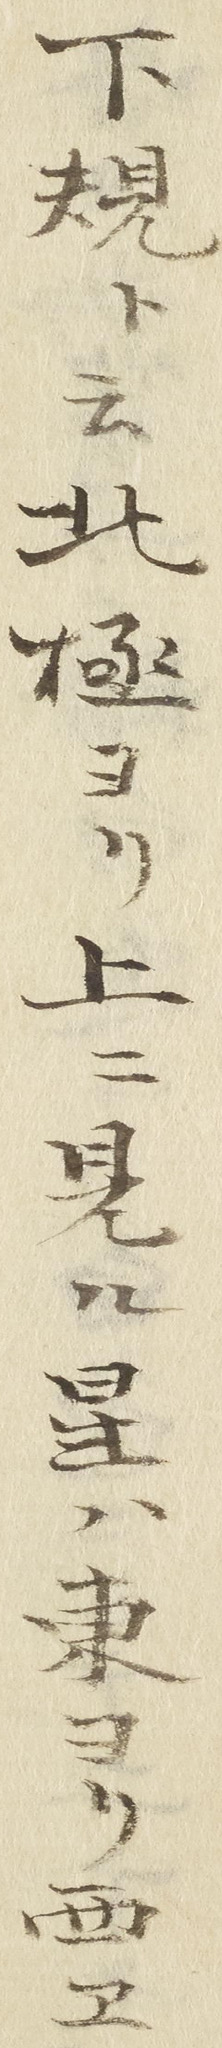下規ト云北極ヨリ上ニ見ル星ハ東ヨリ西ヱ
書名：天象話説
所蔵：東京大学地震研究所図書室 Earthquake Research Institute Library, The University of Tokyo, JAPAN
